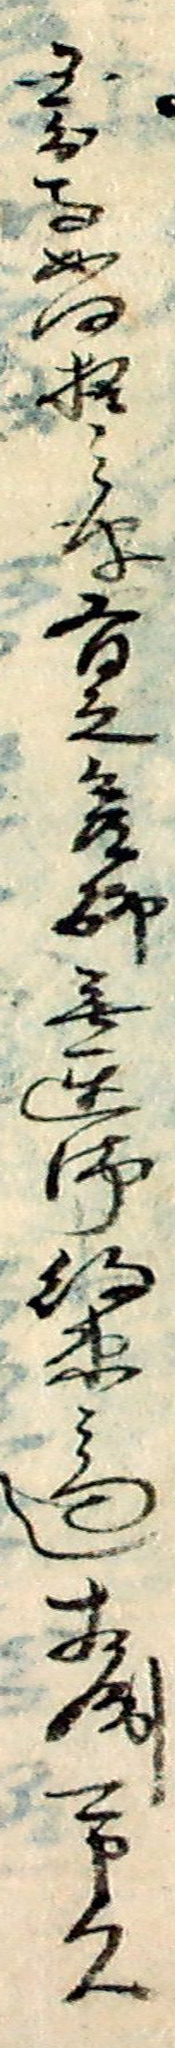国分寺如何様之儀有之候共聊無遅滞約束之通相渡し可申候
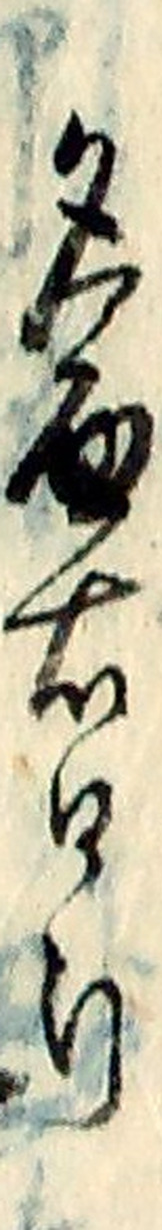名面右同断
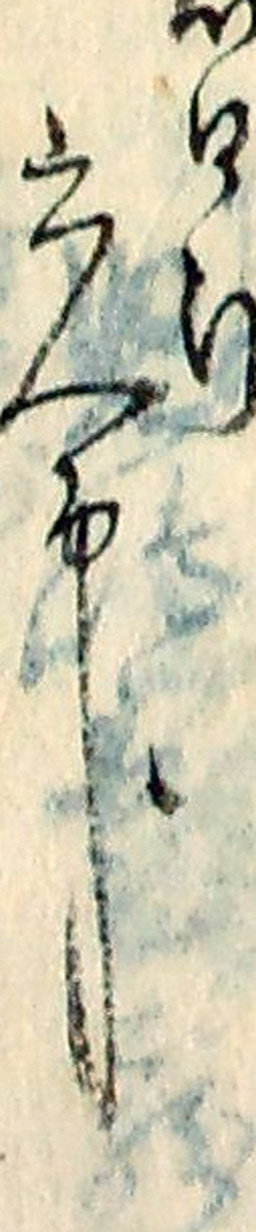六人中
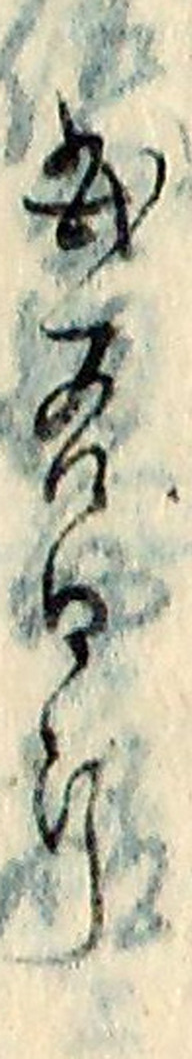当右同断
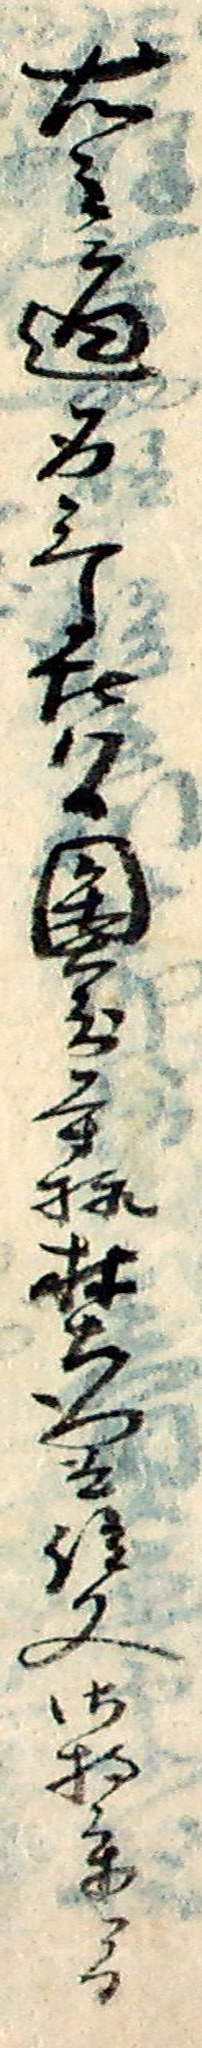右之通酉三月廿八日国分寺様林右衛門殿証文御持参にて
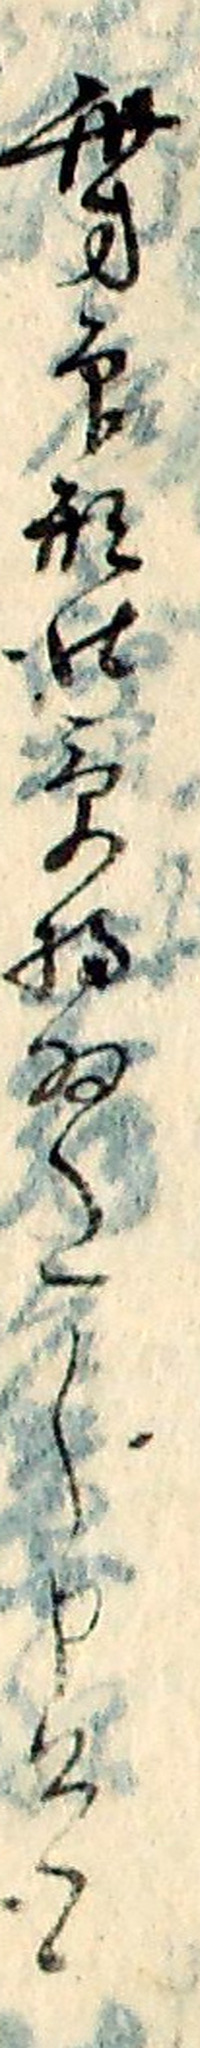此方印形仕受持ゐたし申候以上

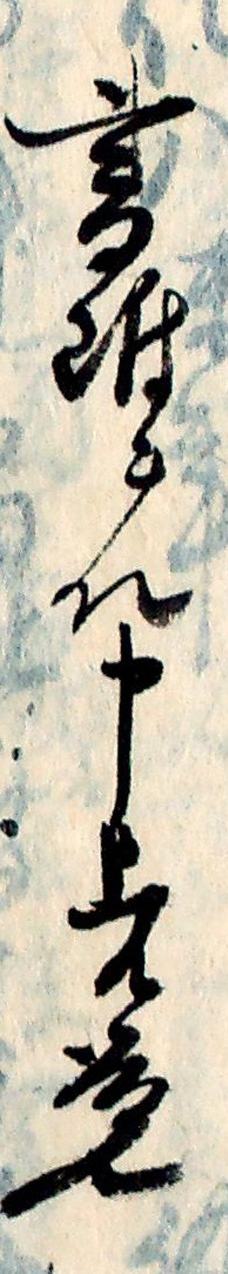書附を以申上候覚
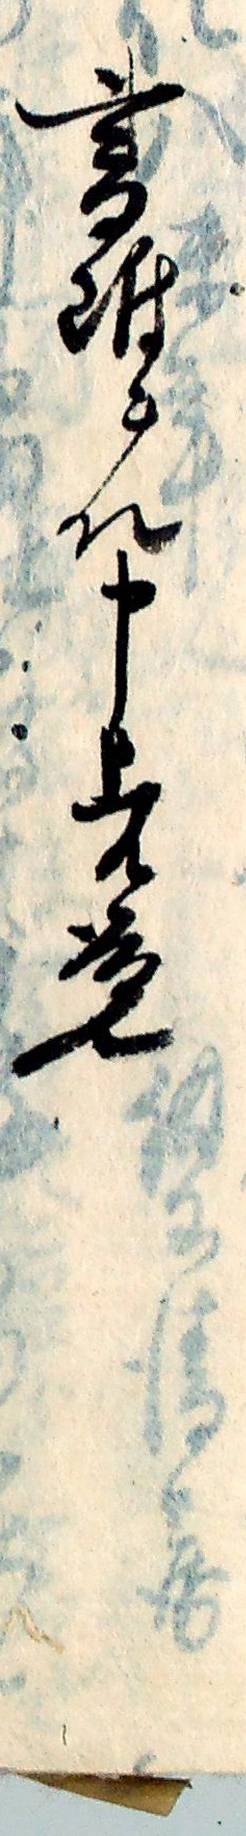書附を以申上候覚
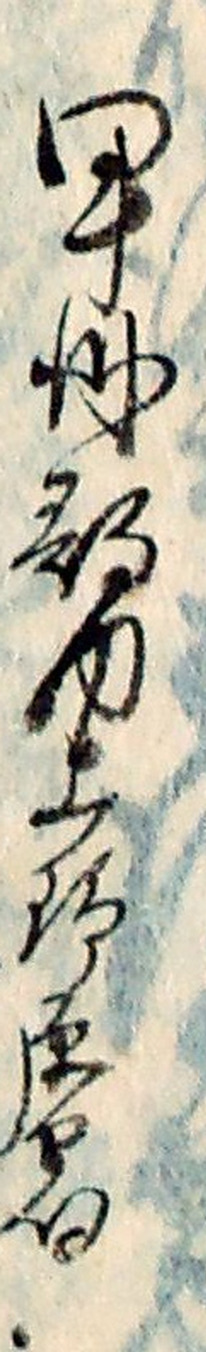甲州郡内上野原宿
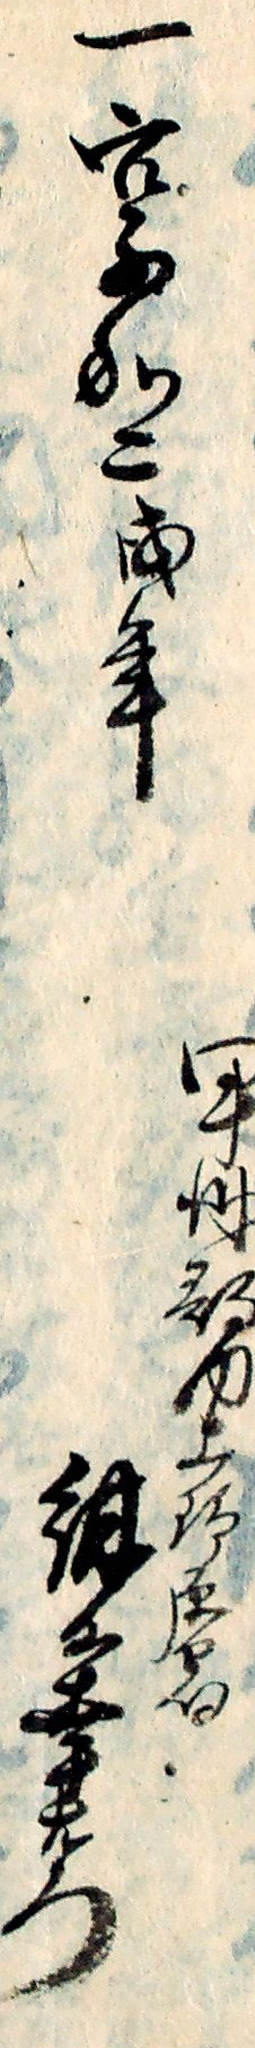一享和二戌年紺屋幸右衛門
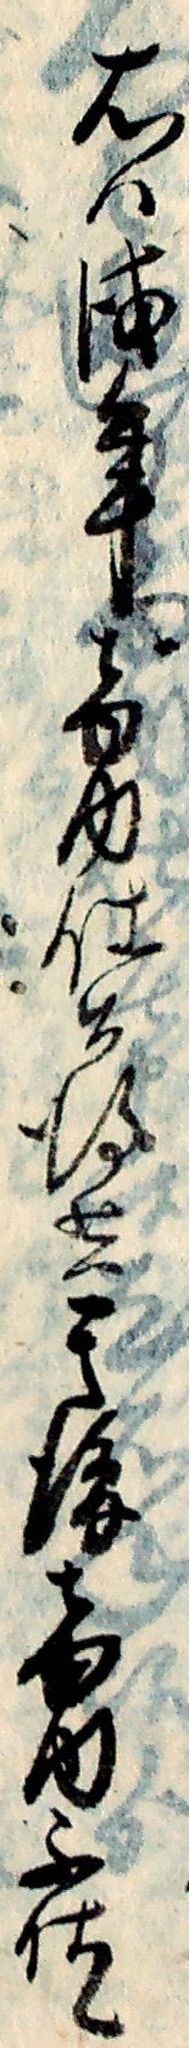右は戌年商内仕候得共其後商内不仕候
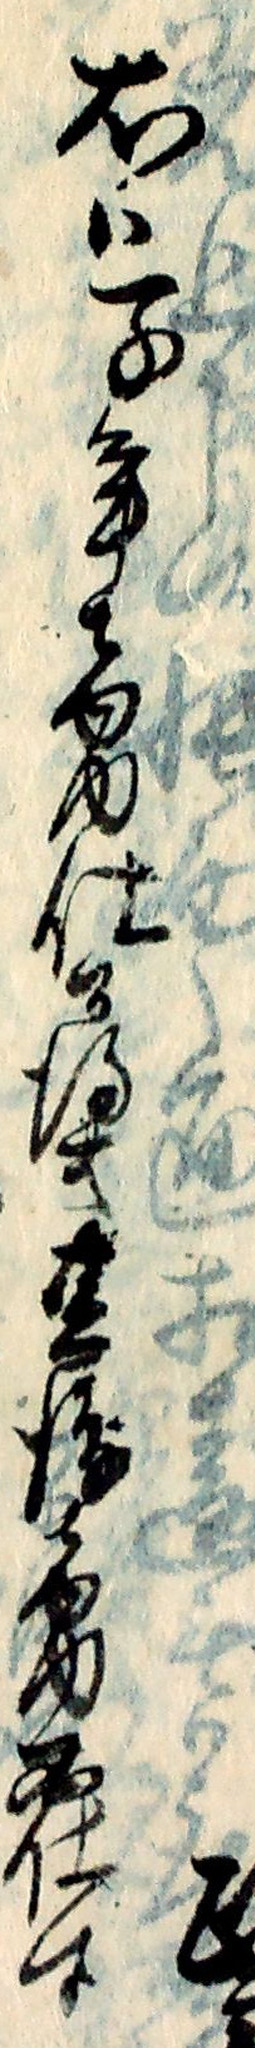右は子年商内仕候得共其後商内不仕候
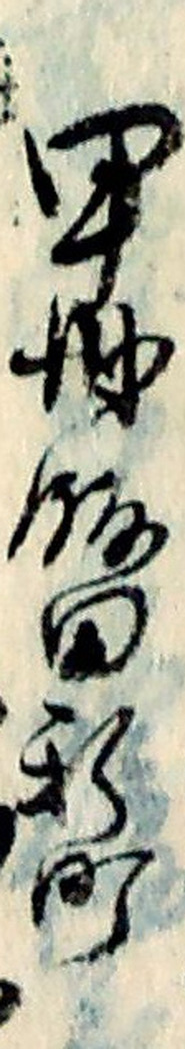甲州飯田新町
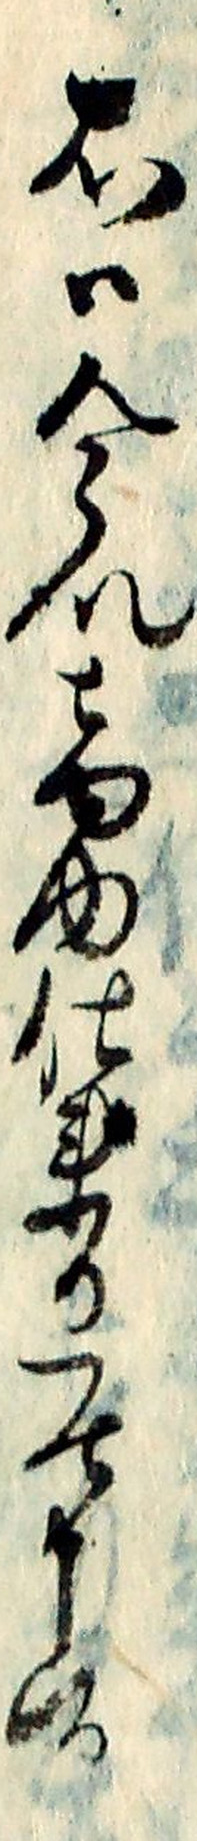右は今以商内仕来り居申候
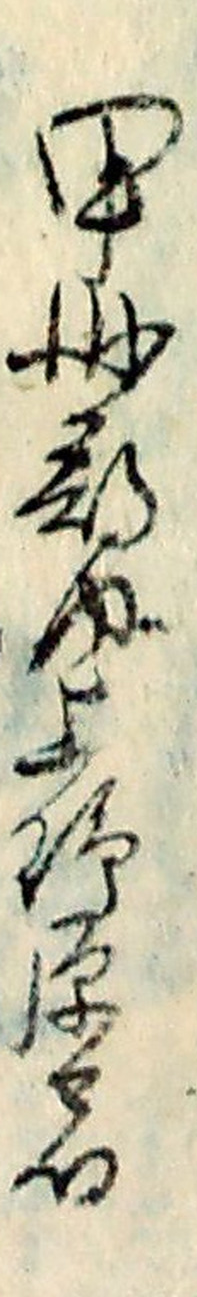甲州郡内上野原宿
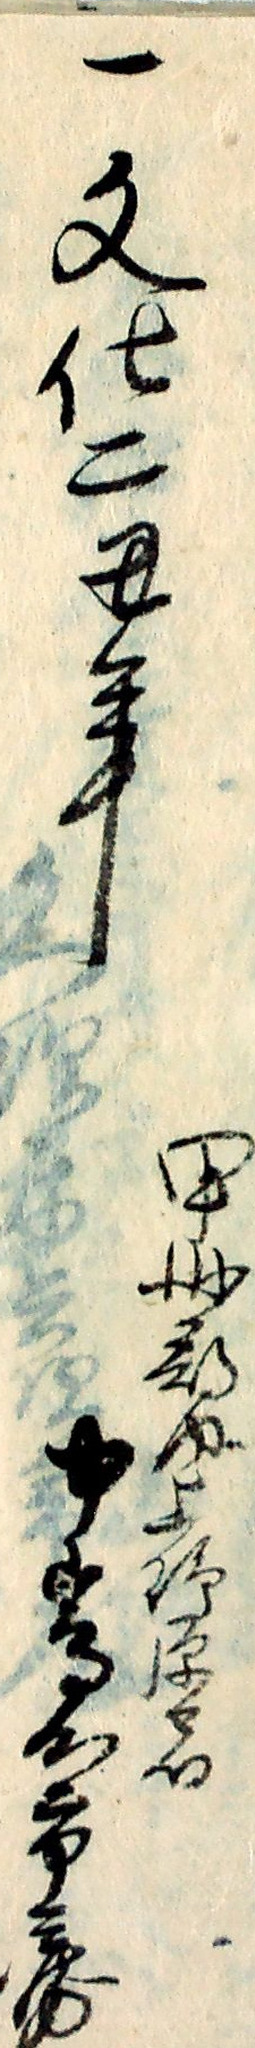一文化二丑年中島屋市兵衛
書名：諸御願書控(後藤氏壱番）
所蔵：鳴門教育大学 Naruto University of Education
